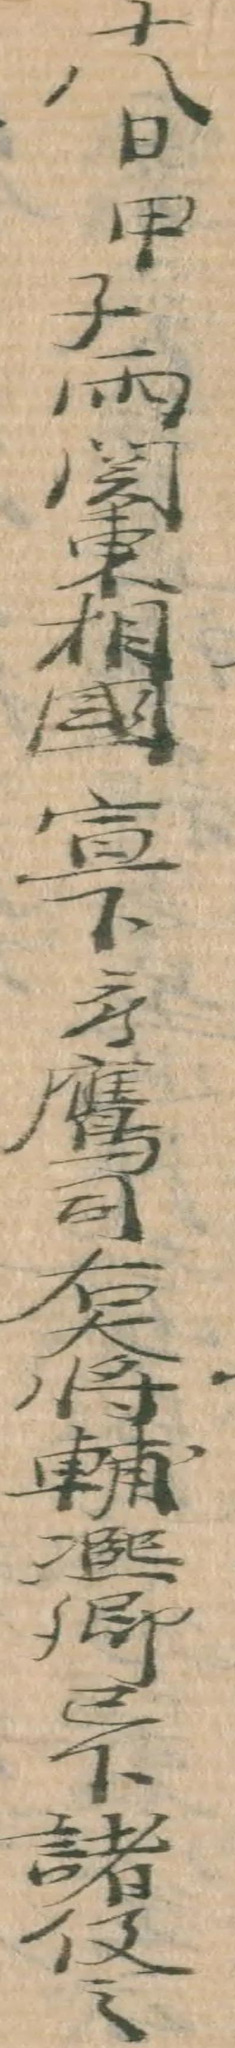十八日甲子雨関東相國宣下ニ付鷹司右大将輔煕卿已下諸役之
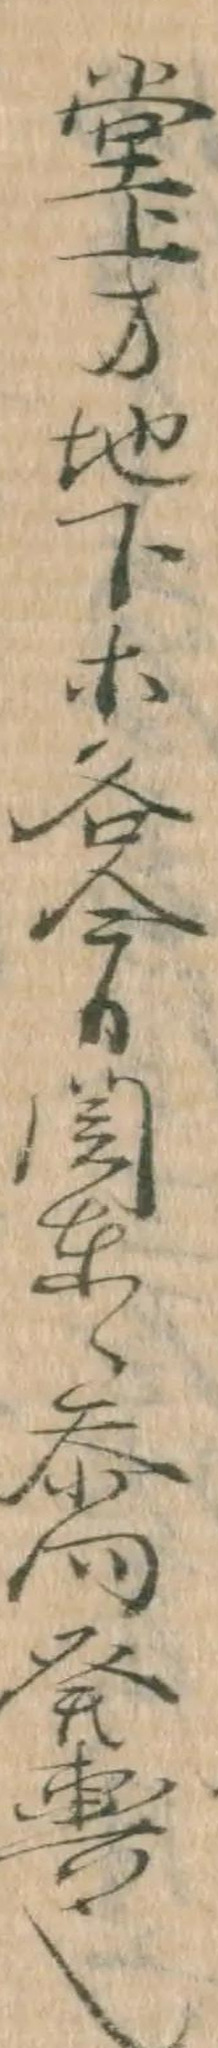堂上方地下等各今日関東へ参向発輿也
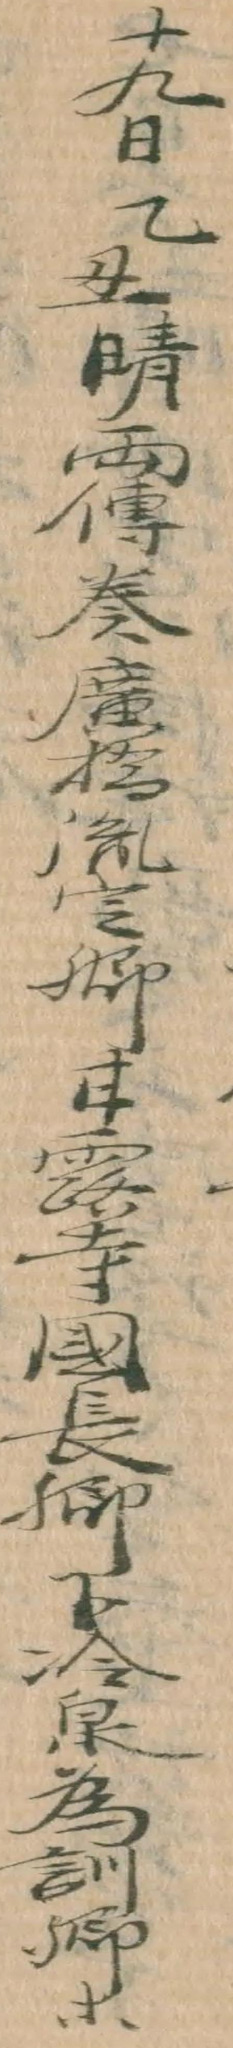十九日乙丑晴両傳奏廣橋胤定卿甘露寺國長卿下冷是為訓卿等
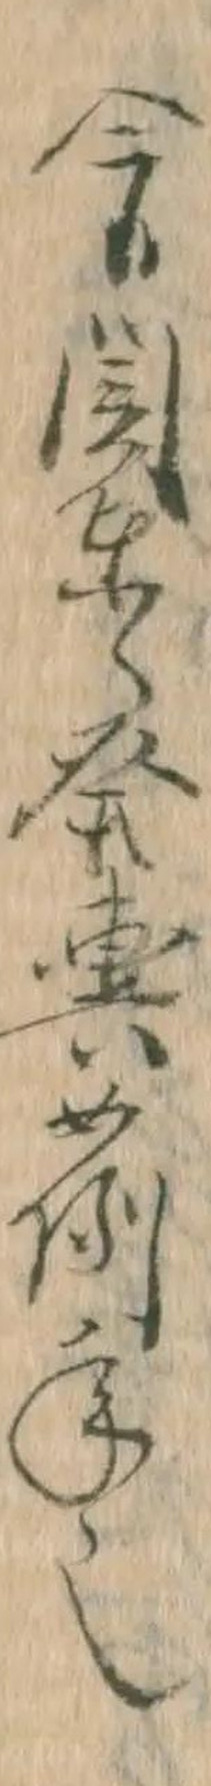今日関東へ発輿如例年也
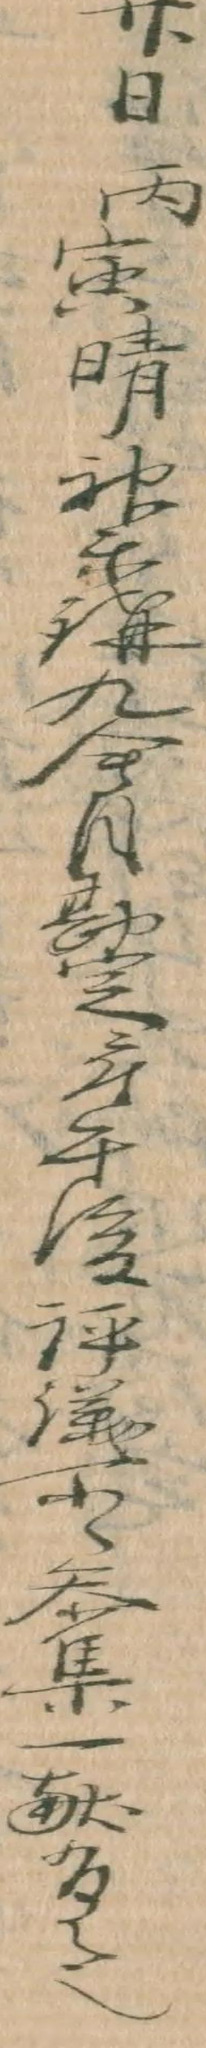廿日丙寅晴神楽講九會月勘定ニ付午後評議所へ参集一献有之也
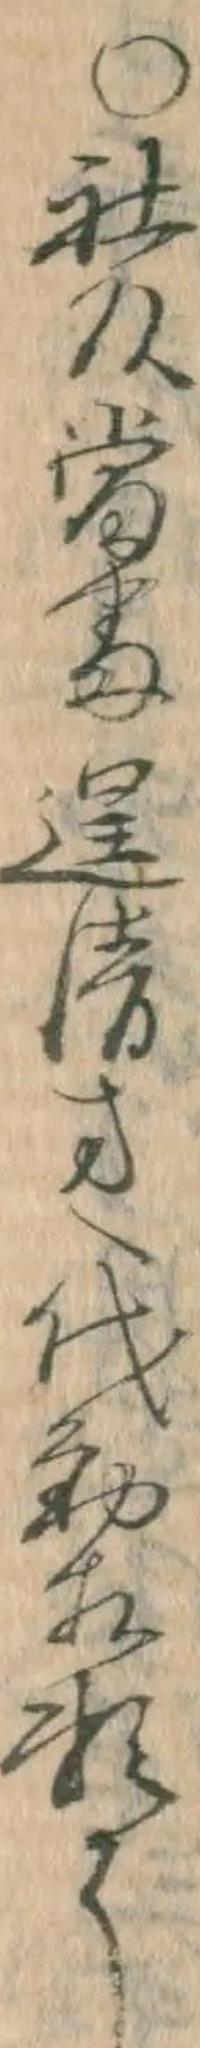○社頭當番逞清方へ代勤相頼了
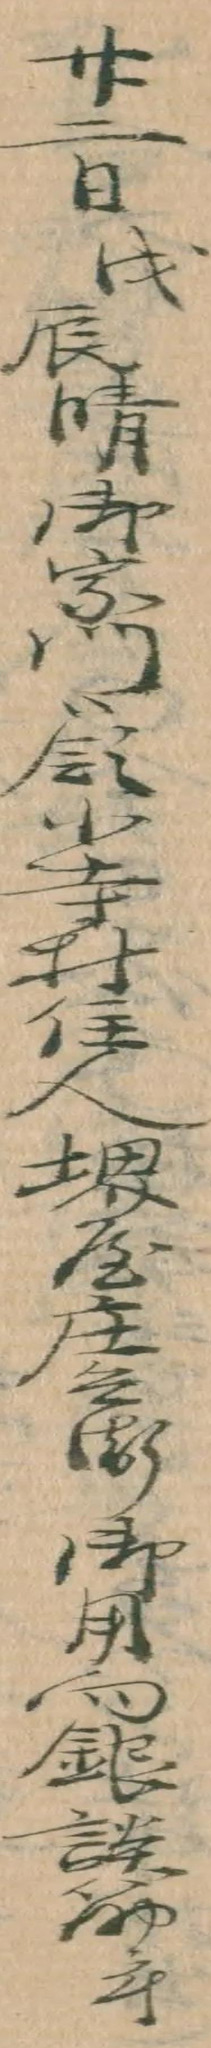廿二日戊辰晴御家門御領小寺村住人堺屋庄兵衛御用向銀談筋ニ付
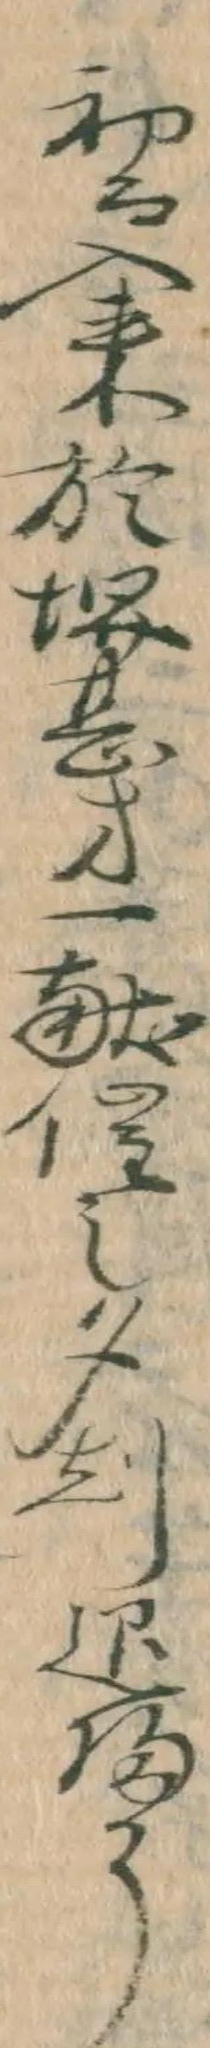初而入来於堺甚方一献催之夕刻退帰之
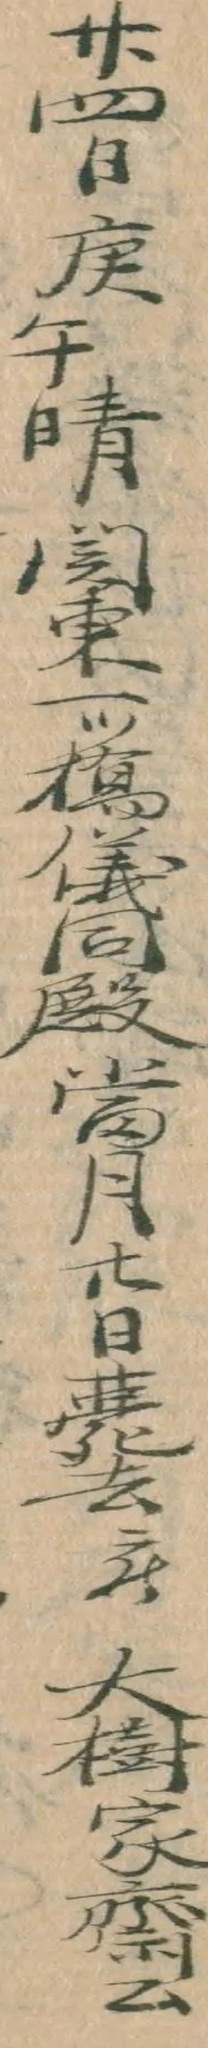廿四日庚午晴関東一ツ橋儀同殿當月廿日薨去ニ付大樹家齋公
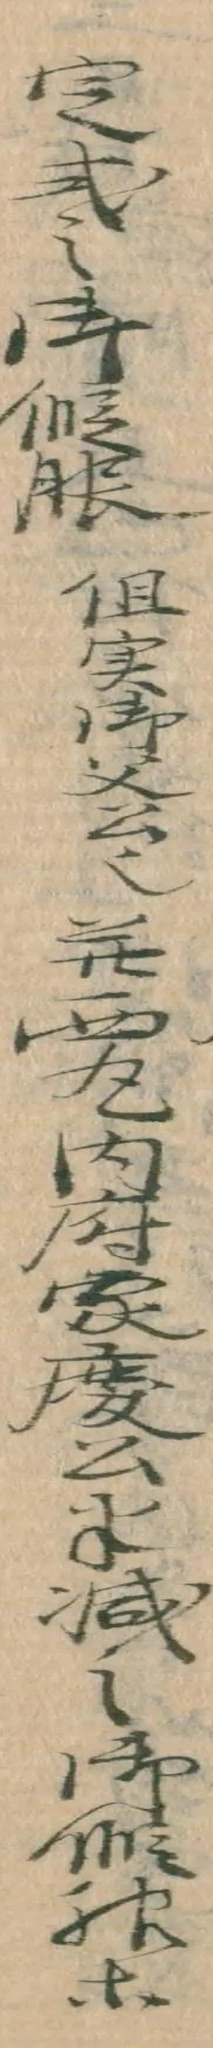定式之御仮服但実父公也并西丸内府家慶公半減之御仮服等
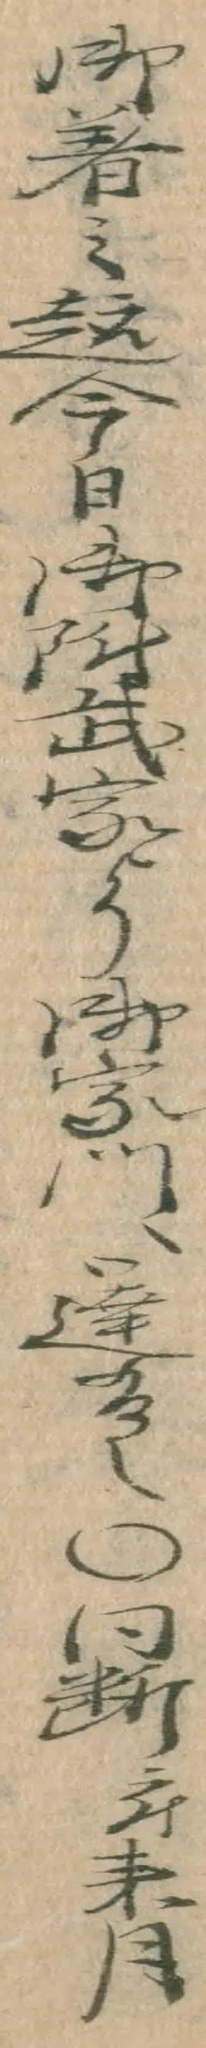御着之趣今日御附武家より御家門へ御達有之○同断ニ付来月
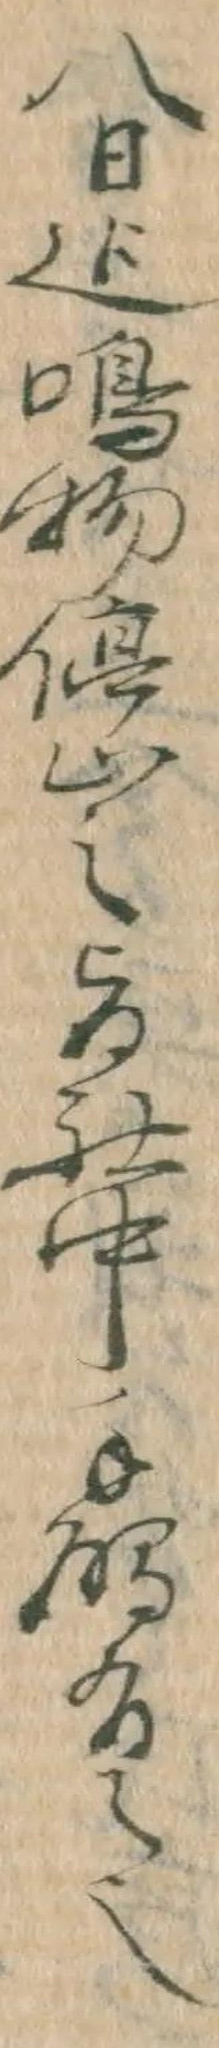八日迄鳴物停止之旨社中手触有之也
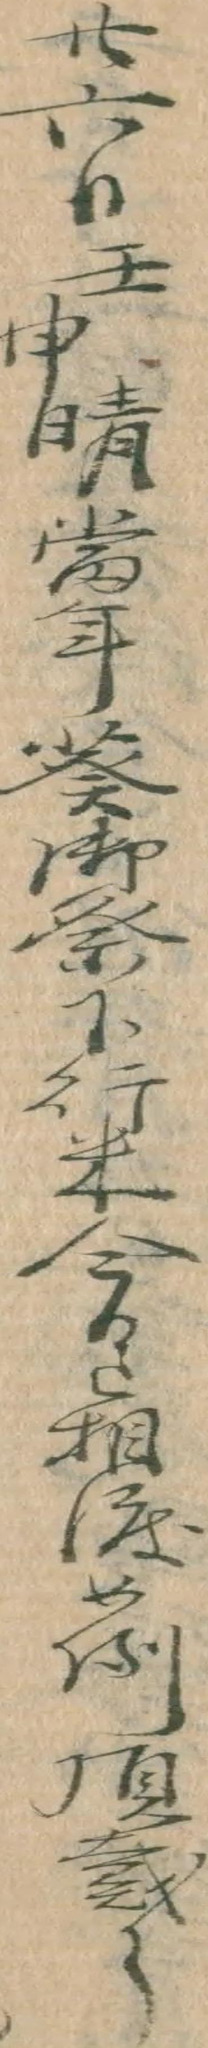廿六日壬申晴當年葵御祭下行米今日被相渡如例頂戴了
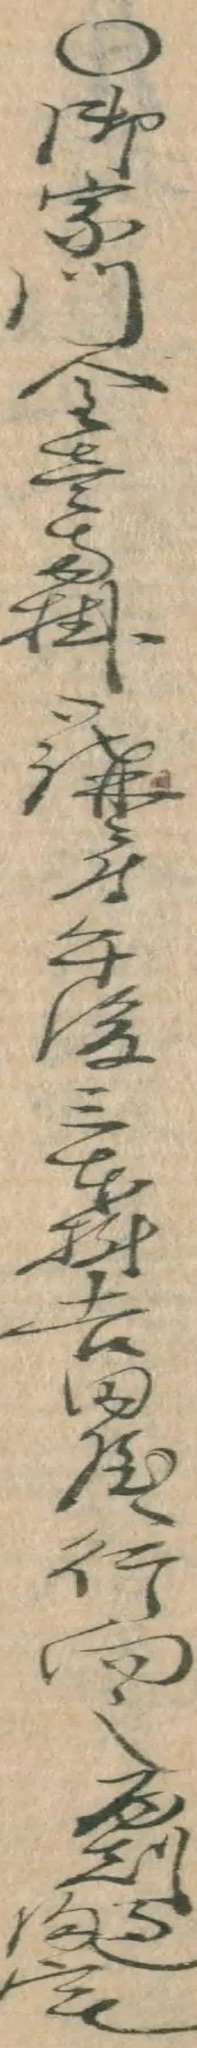○御家門金壱両掛御講ニ付午後三本并吉田屋へ行向也酉刻迄帰宅
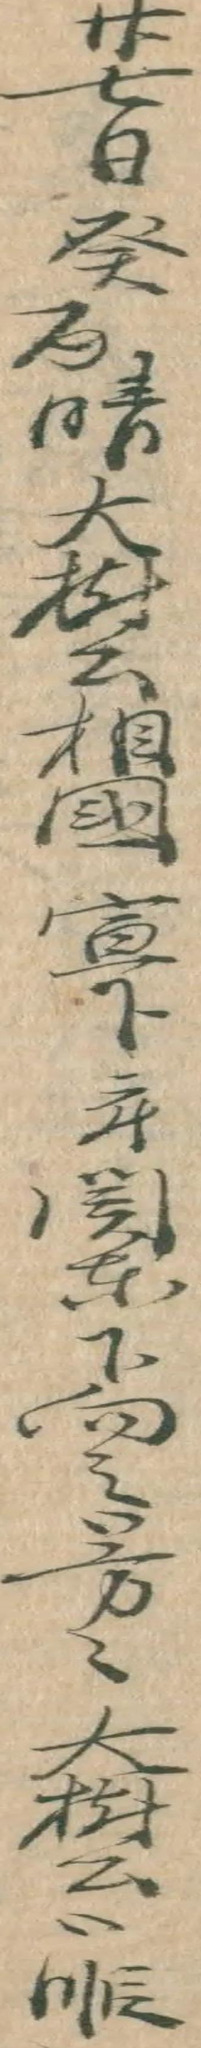廿七日癸酉晴大樹公相國宣下ニ付関東下向之御方々大樹公御暇
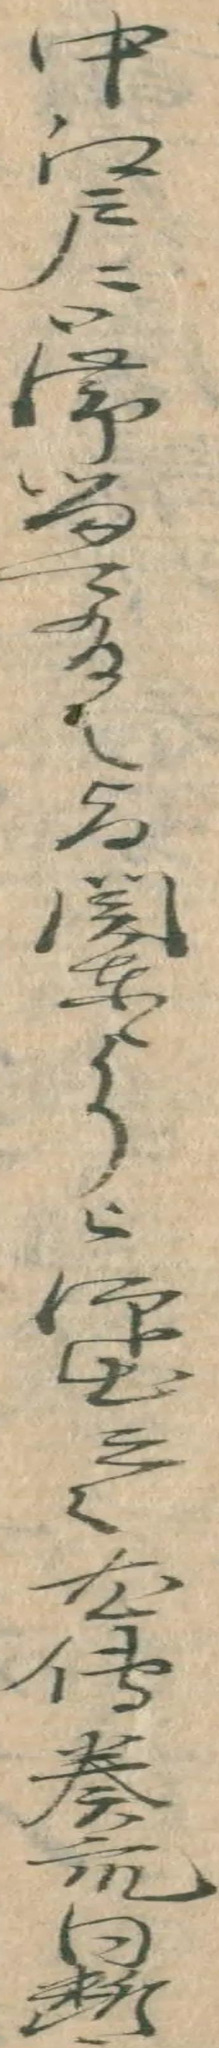中江戸ニ御滞留可有之旨関東より被仰出云々尤傳奏衆同断也
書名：賀茂社記録. 第65冊
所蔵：国立国会図書館 National Diet Library, JAPAN
